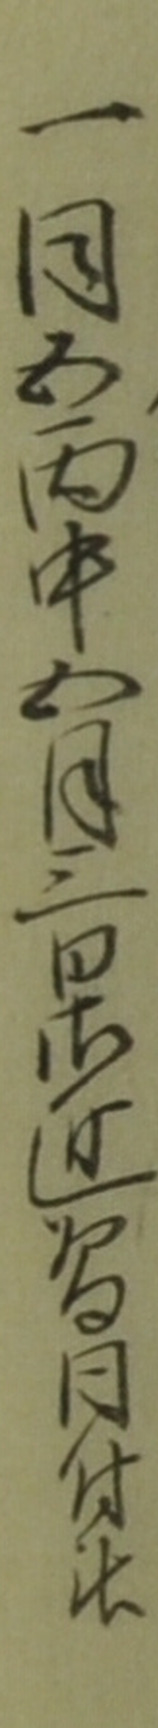一同五丙申五月三日御近習目付被
